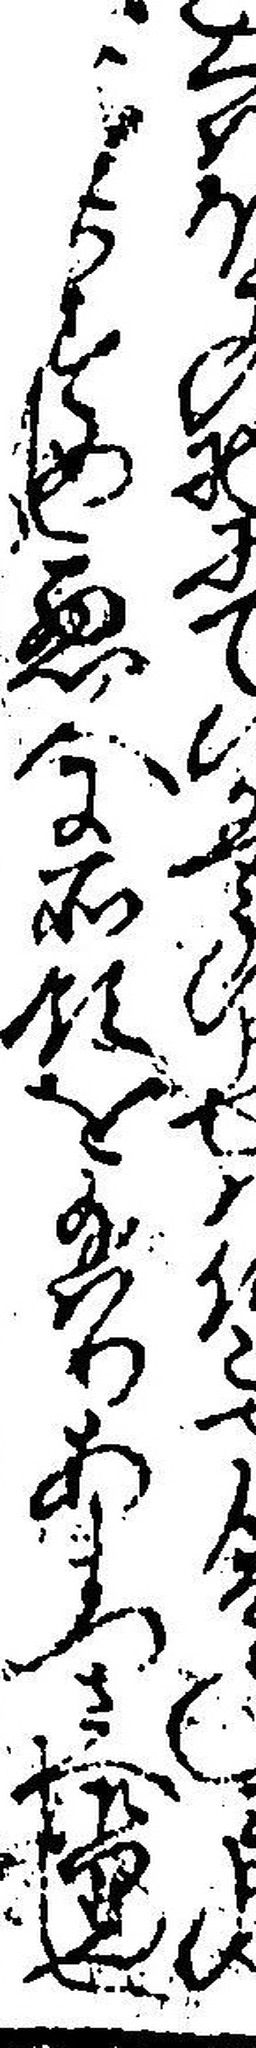すめし悪人に所領を給はりあまつさへ御りんし

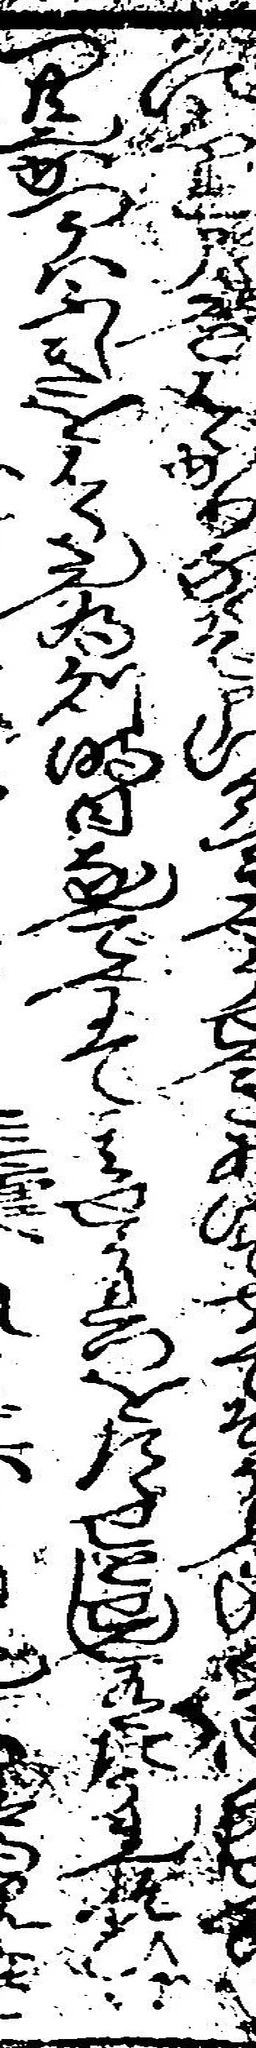つ共也かつうはふしきをはらさんため則明日なんでんにて其せうれつをたゝせとせんし有るたうまん悦ひ
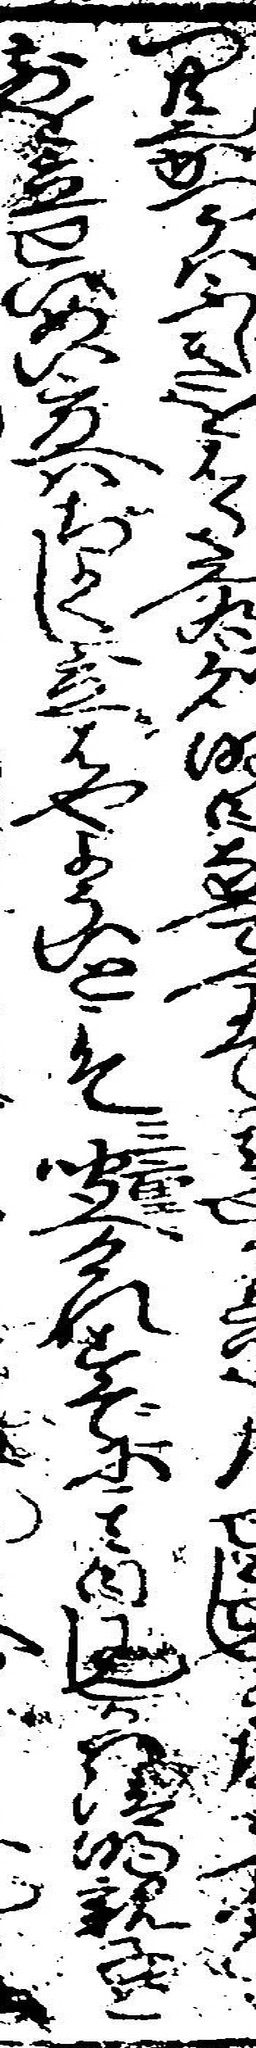前を立せいめい方へはぢよくし立はやよういとこそ三重聞へけれすでに其日に也しかは清明親子と
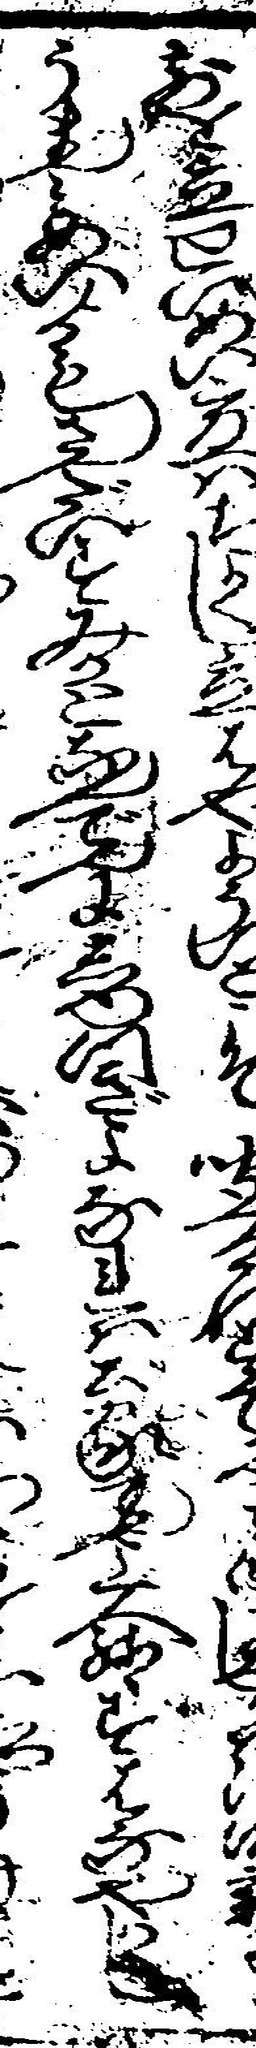うまんみめいゟもさんだいすみかとなんでんにしゆつぎよなれは公家てん上人残らすはなやかし
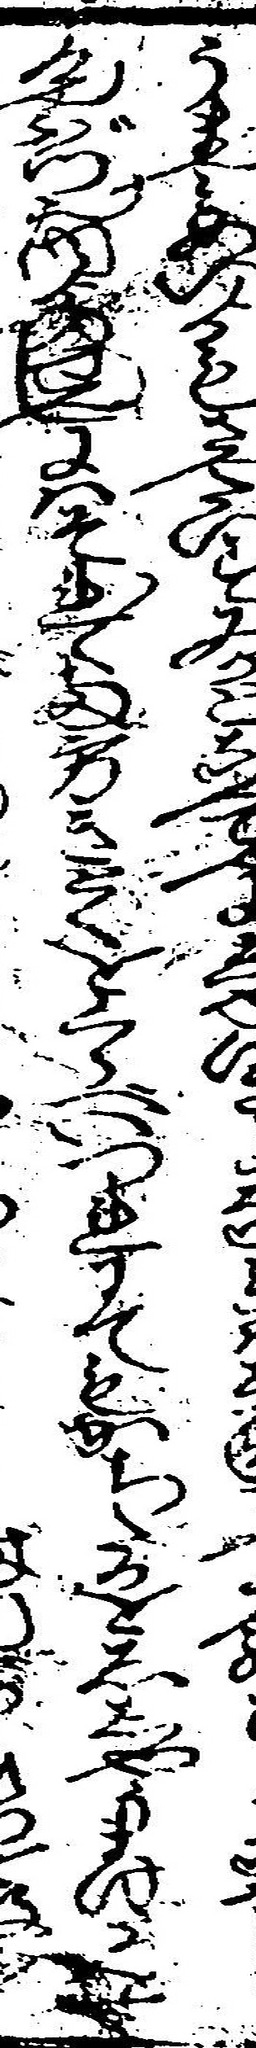けんぶつ也内ゟのせんしにはそれ〳〵両方きとくをくらべいつれにてもかちたるをししやうまけたるを
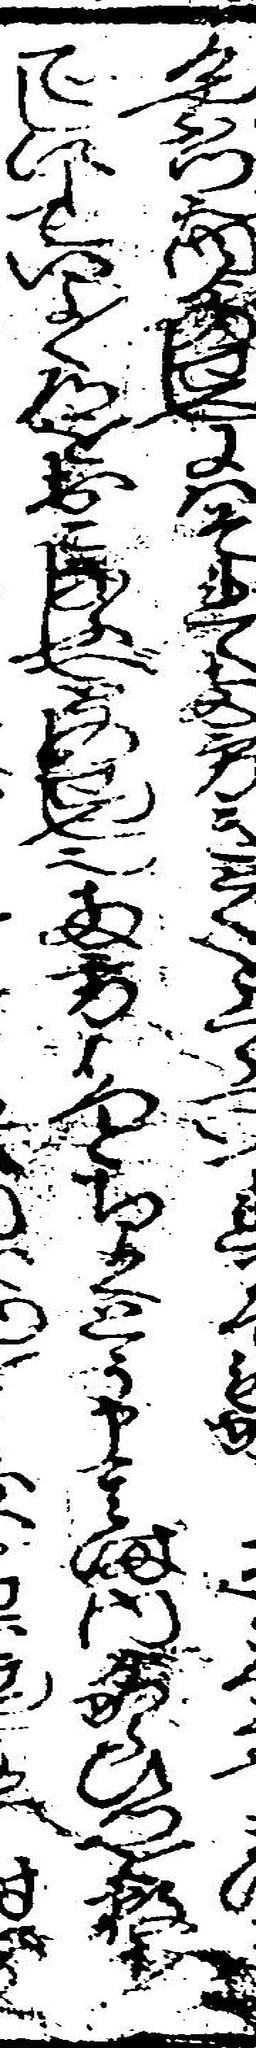でしにしていよ〳〵道をおこなふべしとのせんし也両方はつとちよくとう申其時内ゟからひつを数
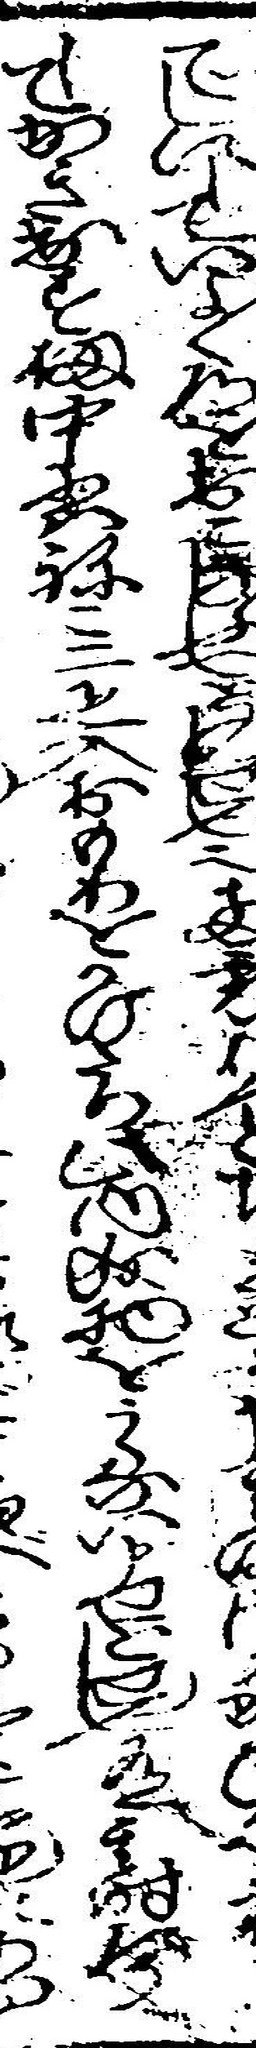してかき出す扨中にはねこ二匹入おもりをかけたり此内をうらない申せとせんし有其時だう
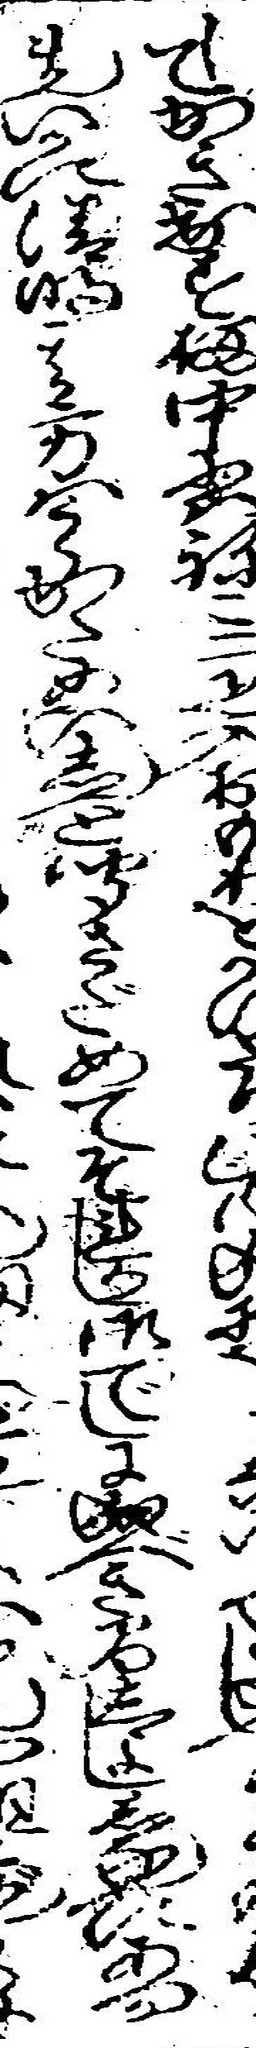まんいかに清明其方はうらかためいしんと聞さだめてそれかし御でしに成べき間しよししなんにあつか
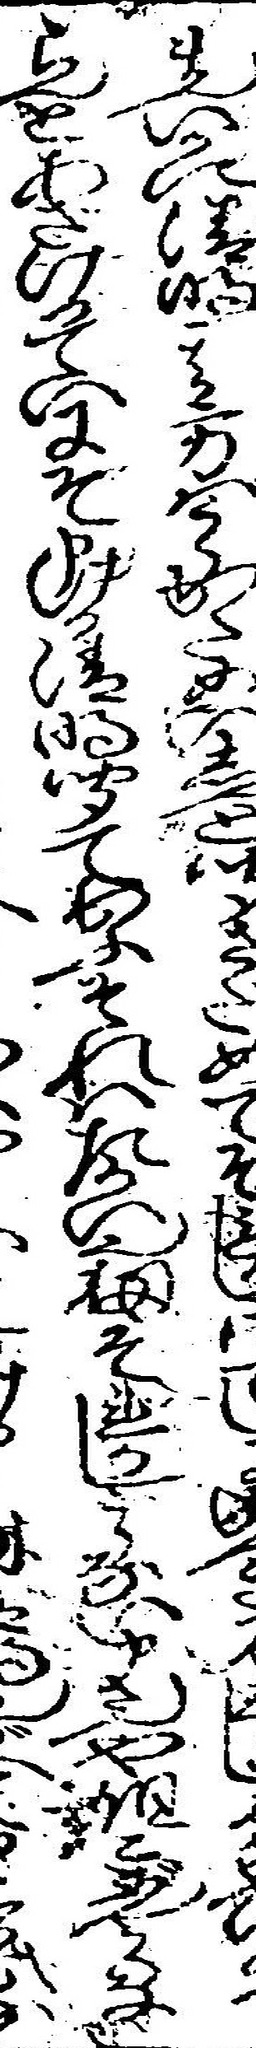らんとあざけるていにそ申ける清明聞ておふそれはたかい也扨それかしうらない申さんや但こぶんうらな
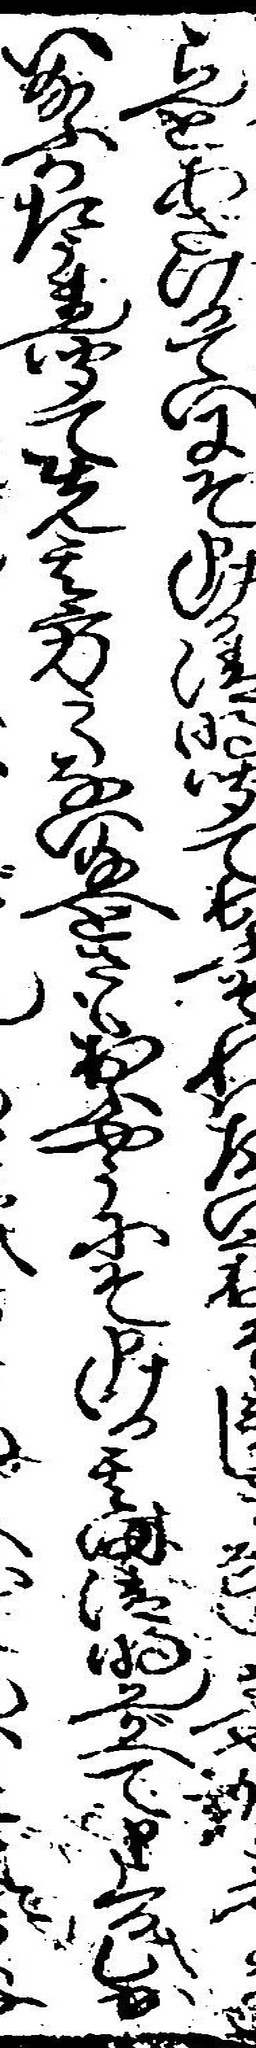い給ふかたうまん聞て先其方うらない給へとさもおふやうにそ申ける其の時清明かんがへて申上る此か
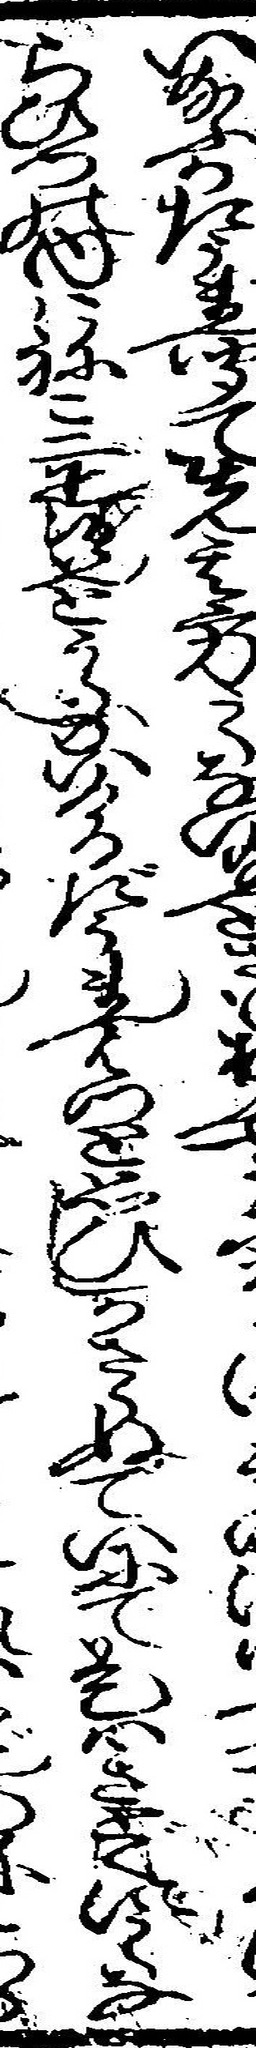らひつの内にねこ二匹候はんとうらないけるだうまんはつと思ひしかさらぬていにて是はきどくにうらな
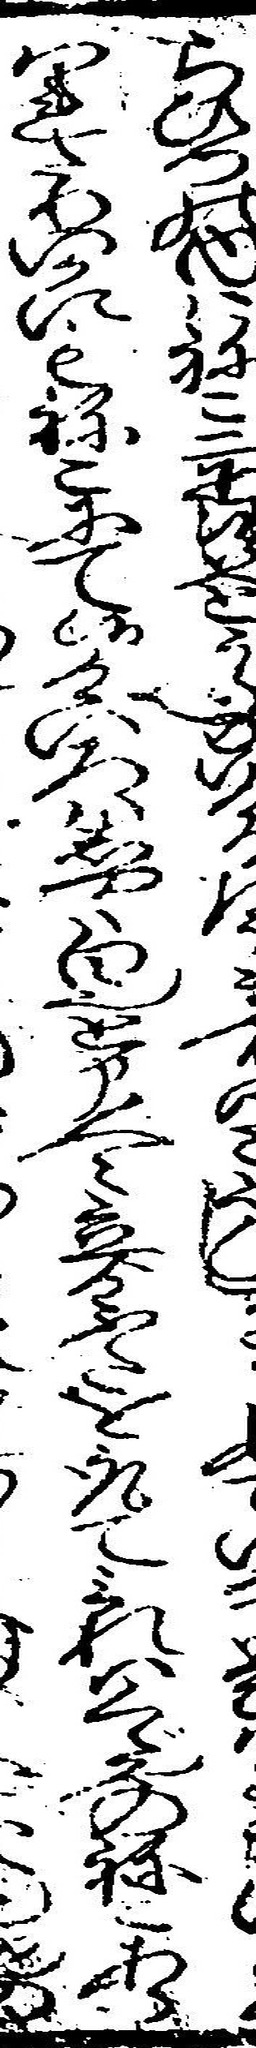はれたりいかにもねこにて候けいろはしやく白也と申人々立ゟふたを取てみれはくだんのねこあら
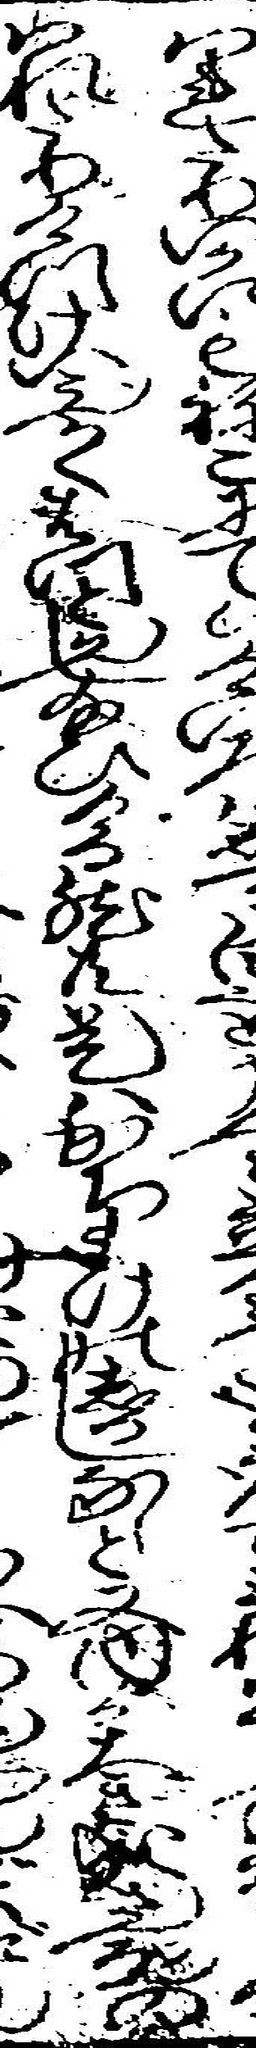はれたりけつけいうんかくはつとかんし給ひける然共是はかちまけのしるしなしと又内ゟ大き成さんの
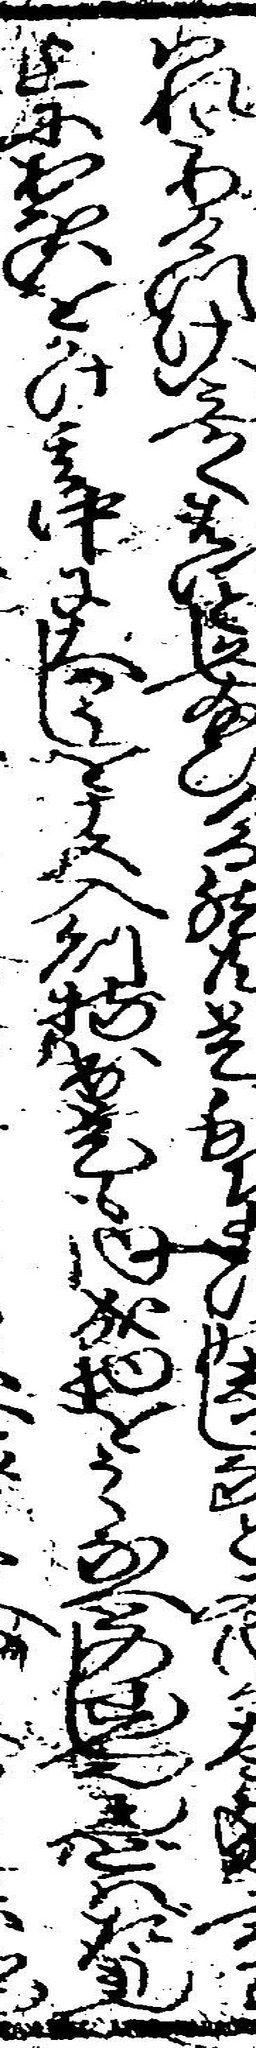上にあほいをかけ其中に大かうし十五入則持出是も内成物をうらなへとのせんし也こんどはだうまん
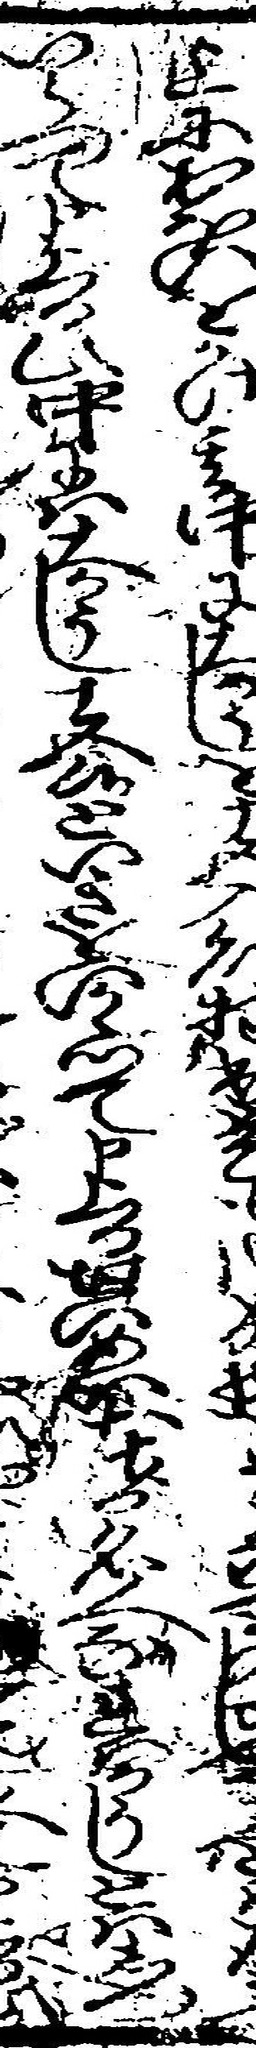いらつて申上る此中には大かうし十五候といきをいかゝつて申上るせいめい本ゟ名人なればかうしとはしつ
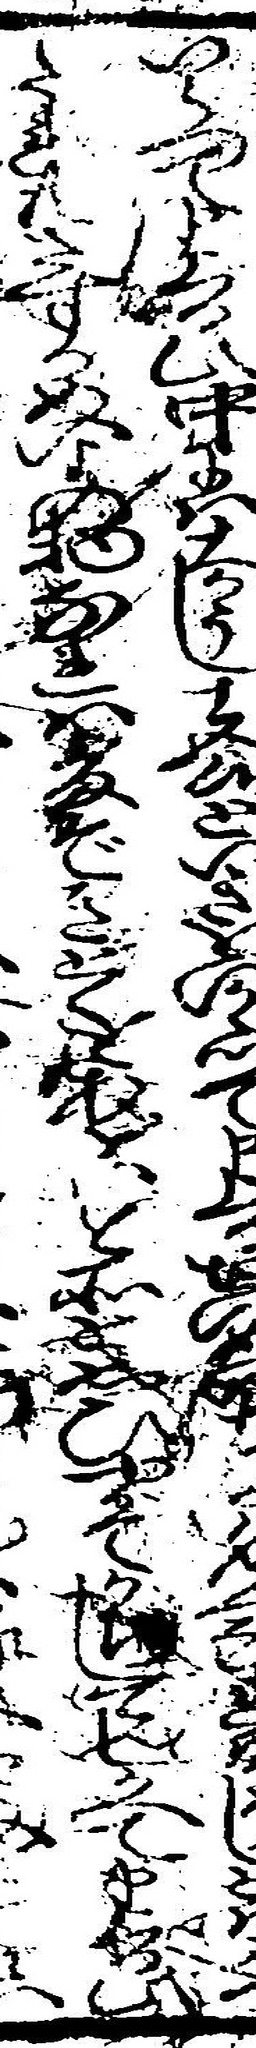たれ共さすかめいよの物なれは爰ぞきとくをあらはす所と思ひやかてかちしてんしかへて申上る此
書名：[しのだづまつりぎつね付あべの清明出生]
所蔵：東京大学総合図書館 General Library in the University of Tokyo, JAPAN
